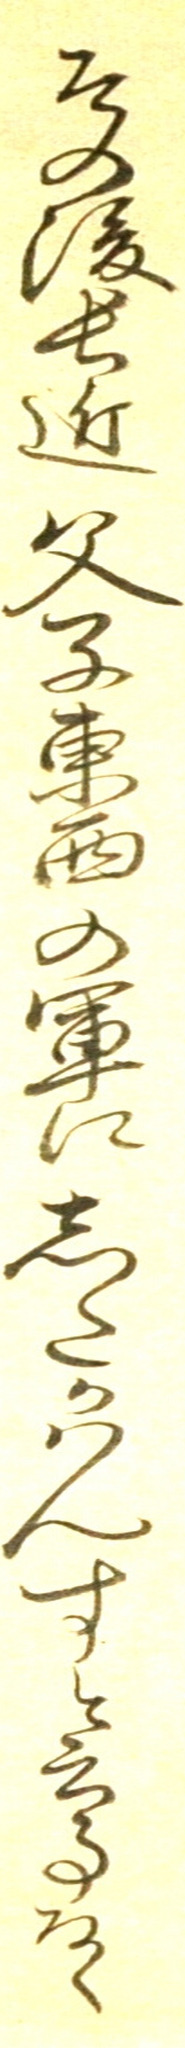その後長近父子東西の軍にしたかはんすと云事なく
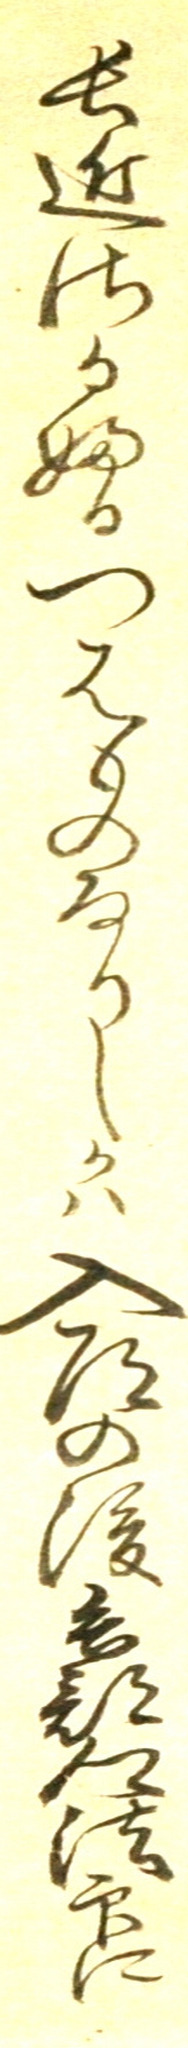長近さるふるつはものなりしかは入道の後兵部卿法印に
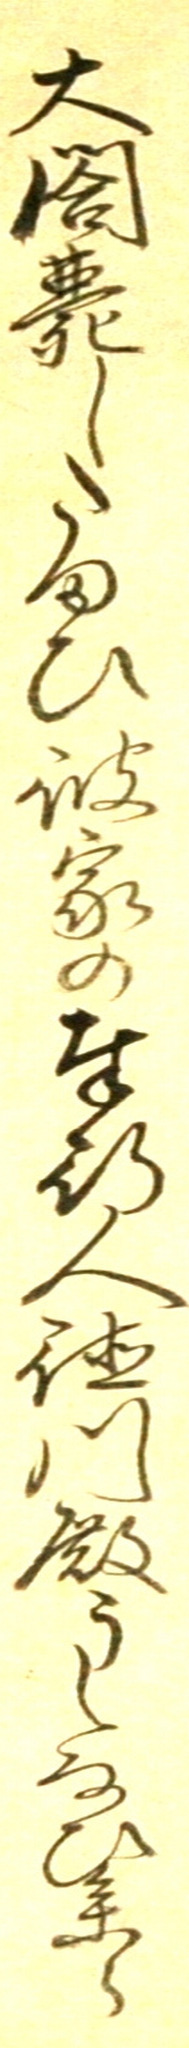大閤薨したまひ彼家の奉行人徳川殿うしなひ参ら
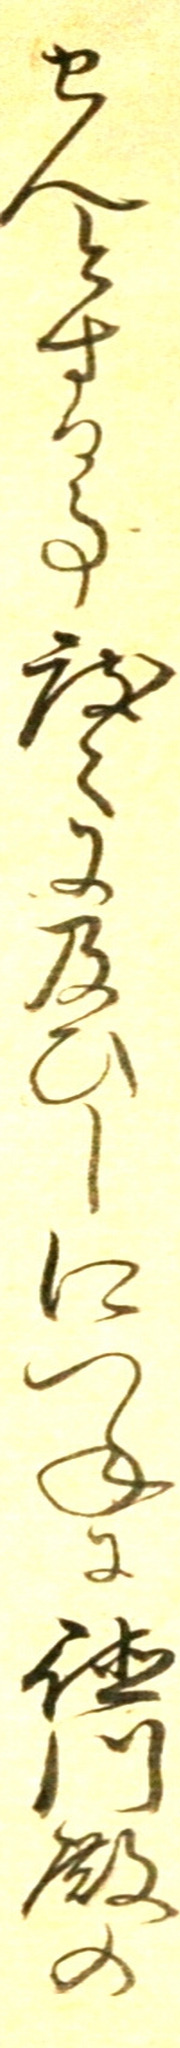せんとする事度々に及ひしにつねに徳川殿の
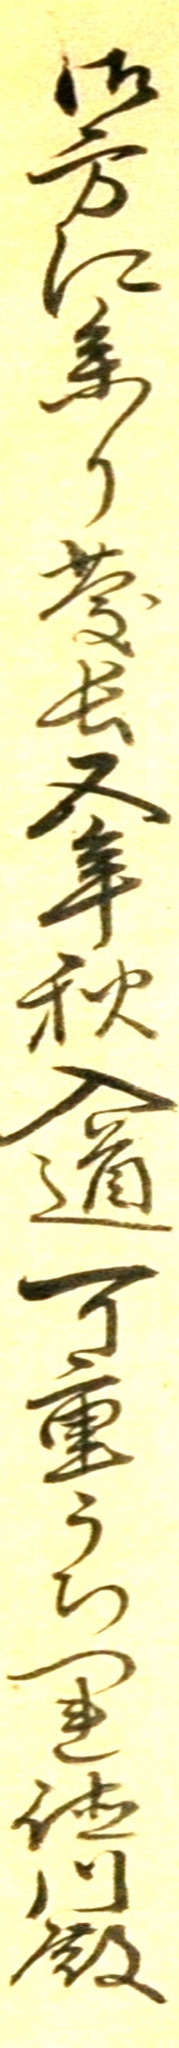御方に参り慶長五年秋入道可重うちつれ徳川殿

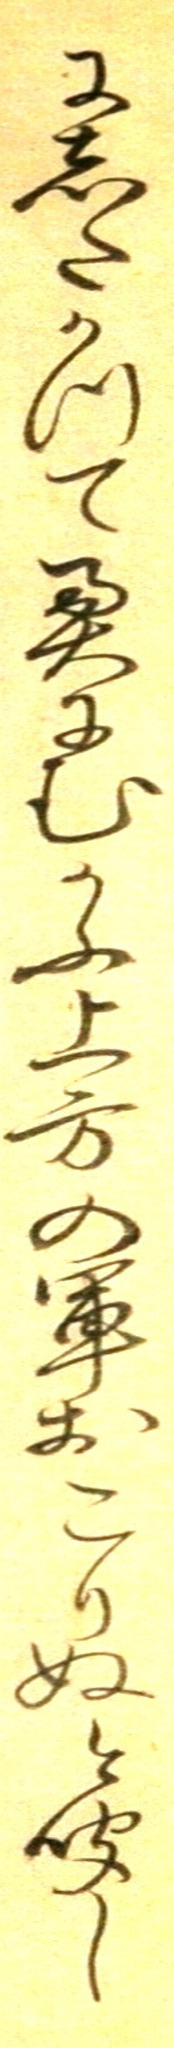にしたかつて奥にむかふ上方の軍おこりぬと聞し
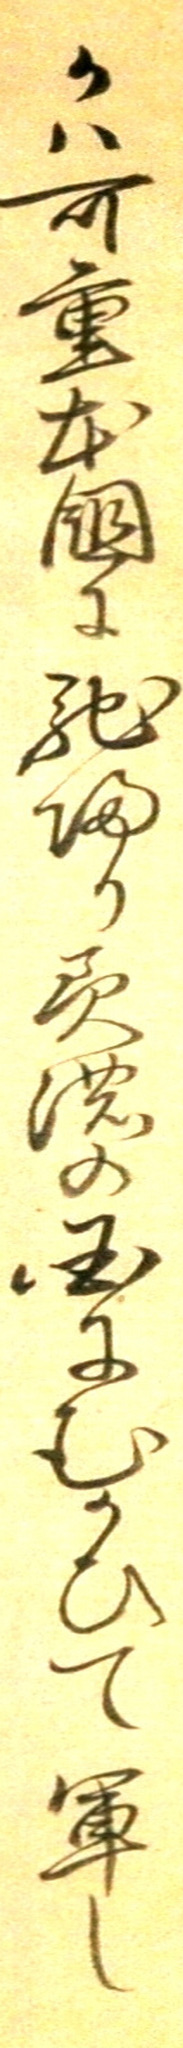かは可重本国に馳帰り美濃の国にむかひて軍し
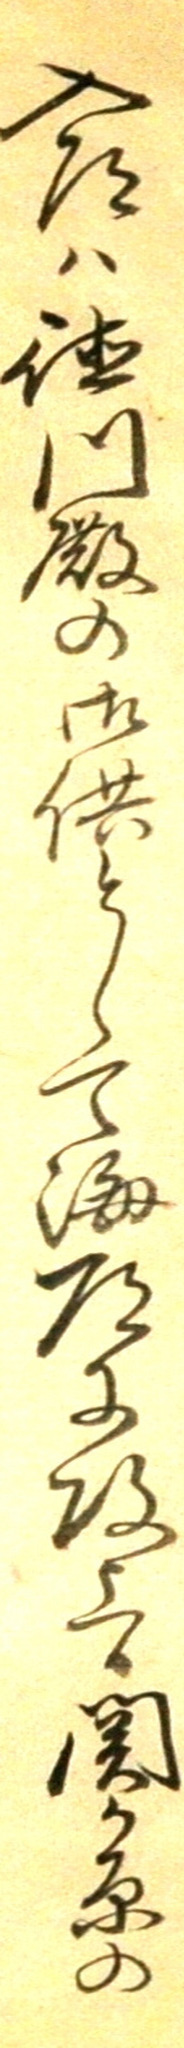入道は徳川殿の御供として海道に攻上る関か原の
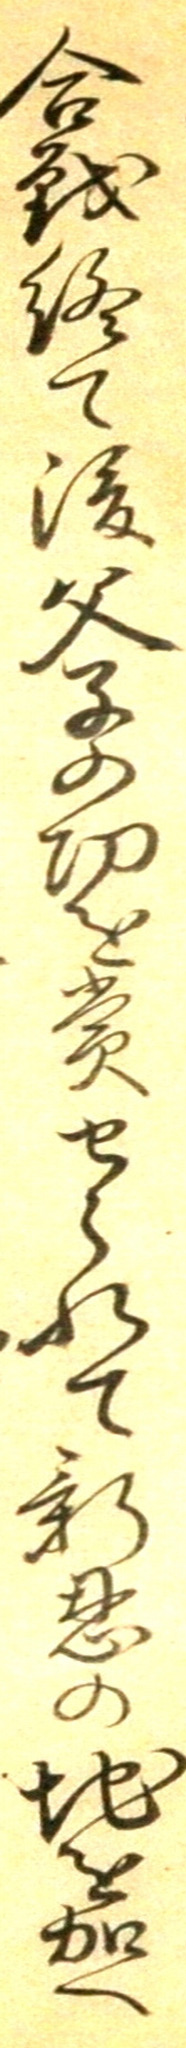合戦終て後父子の功を賞せられて新恩の地を加へ
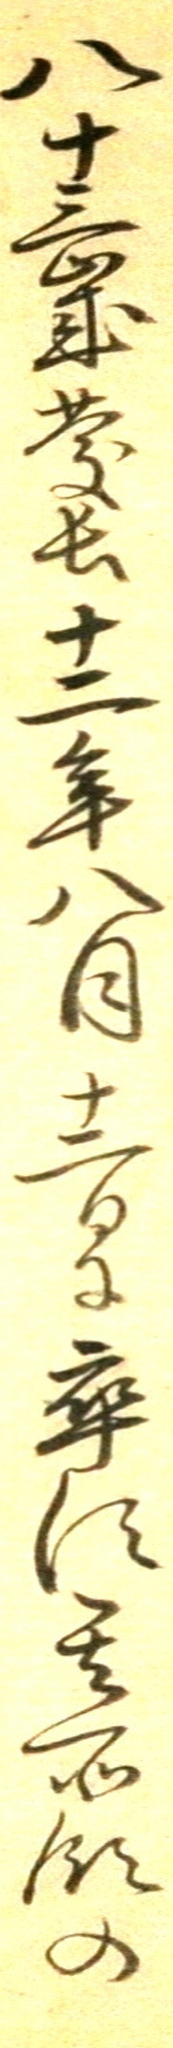八十三歳慶長十二年八月十二日に卒す其所領の
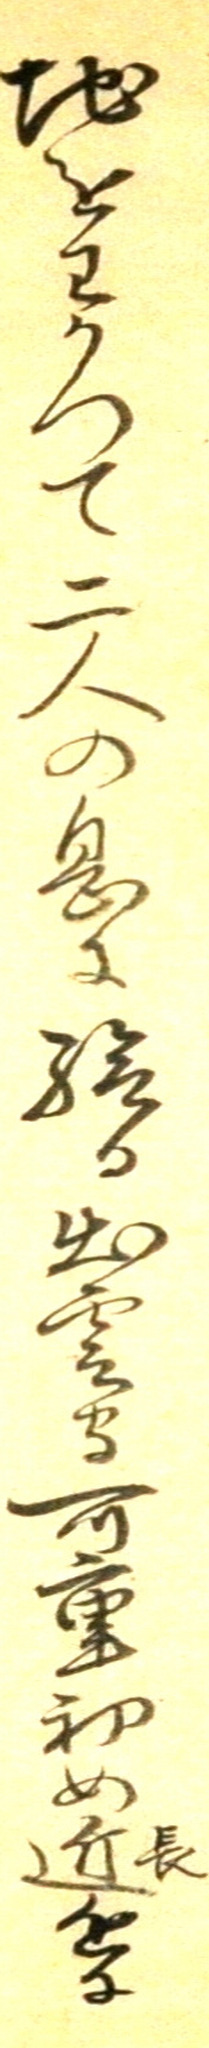地をわかつて二人の息に給る出雲守可重初め近近に
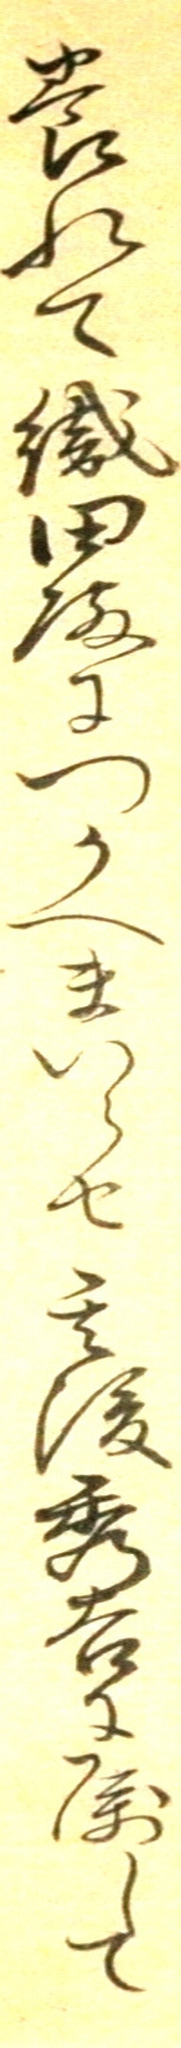養れて織田殿につかへまいらせ其後秀吉に属して
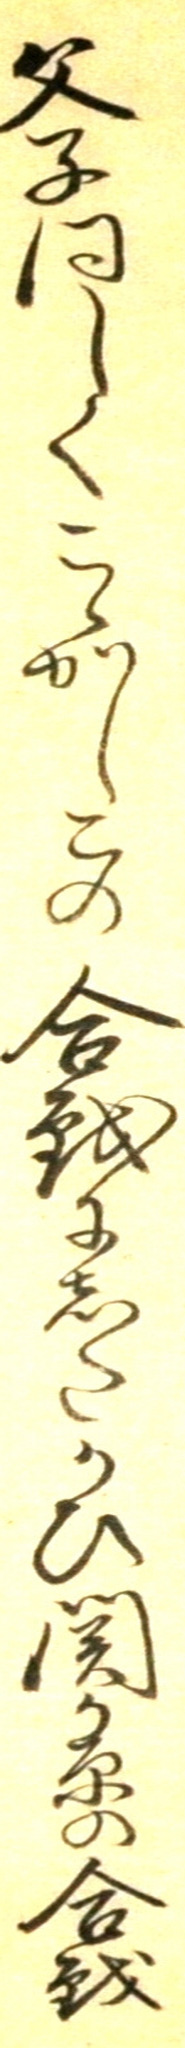父子同しくこゝかしこの合戦にしたかひ関か原の合戦
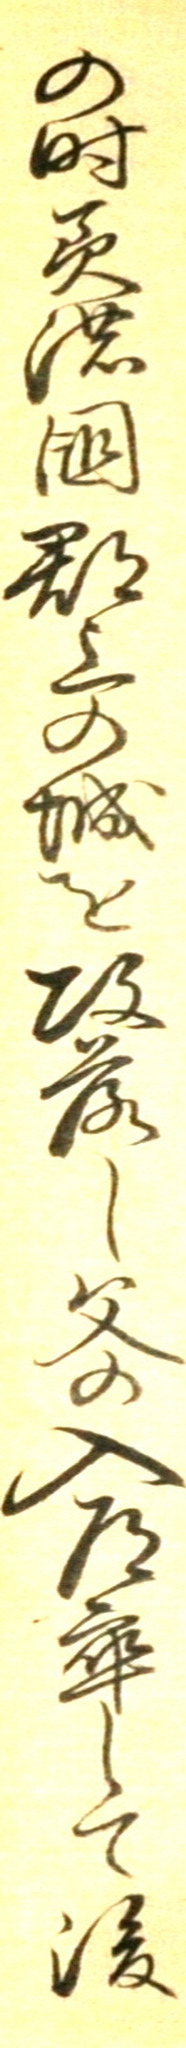の時美濃国郡上の城を攻落し父の入道卒して後
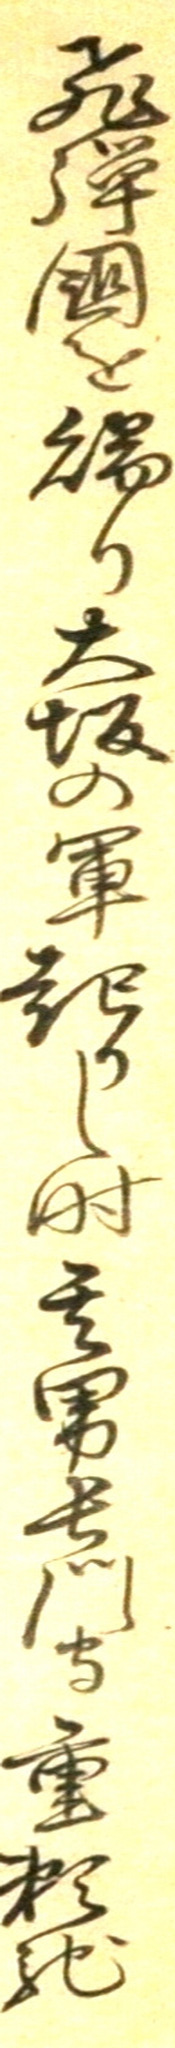飛騨国を賜り大坂の軍起りし時其男長門守重頼馳
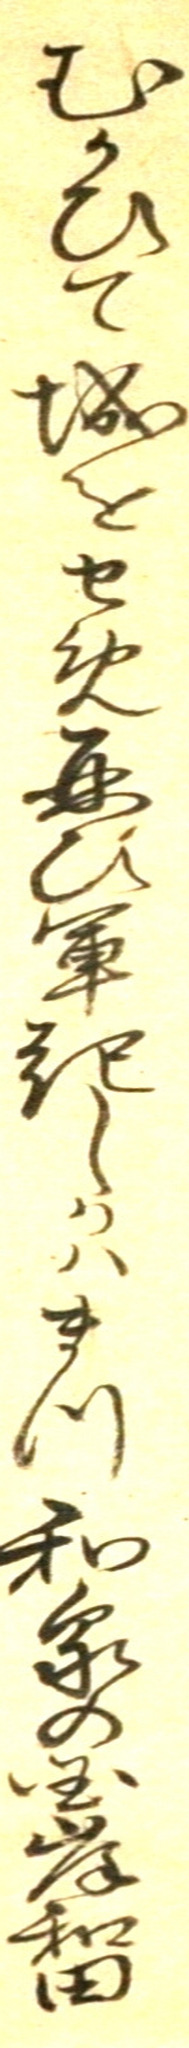むかひて城をせめ再ひ軍起しかはまつ和泉の国岸和田
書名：藩翰譜（九・上）
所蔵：伊那市立高遠町図書館・合同会社AMANE
